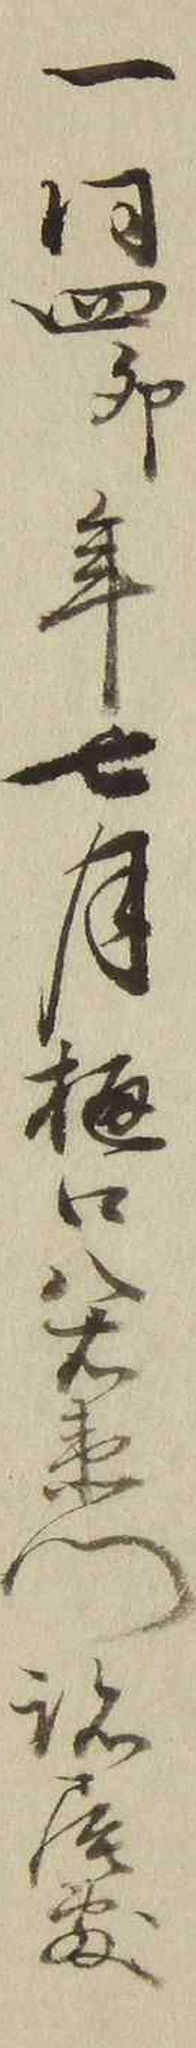一同四卯年七月樋口八右衛門跡屋敷
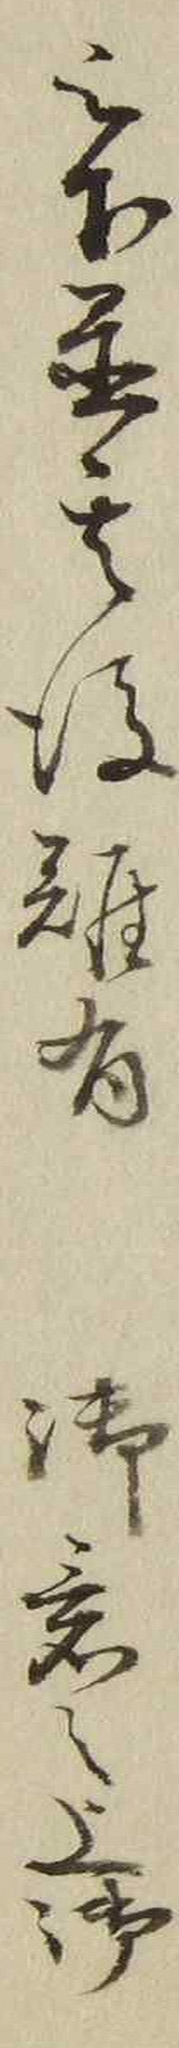被下置其後難有御意之上御
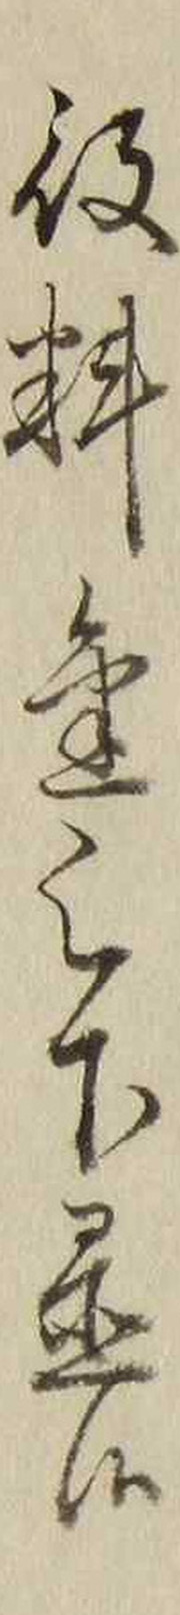役料金被下置候

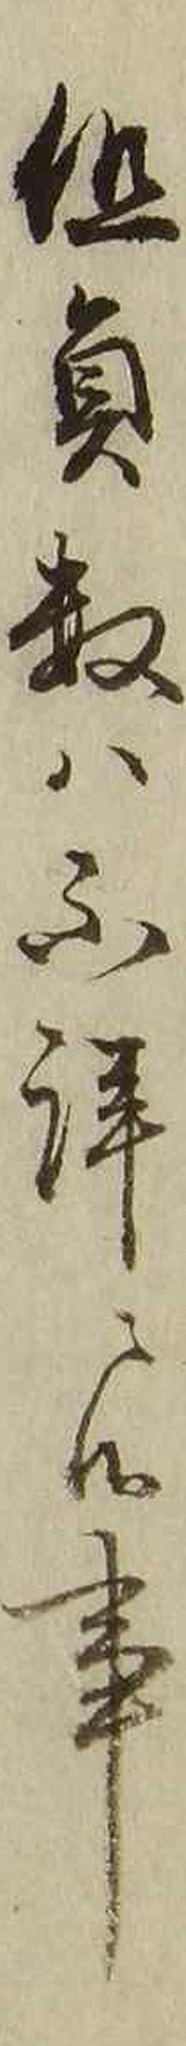但員数ハ不詳ニ候事
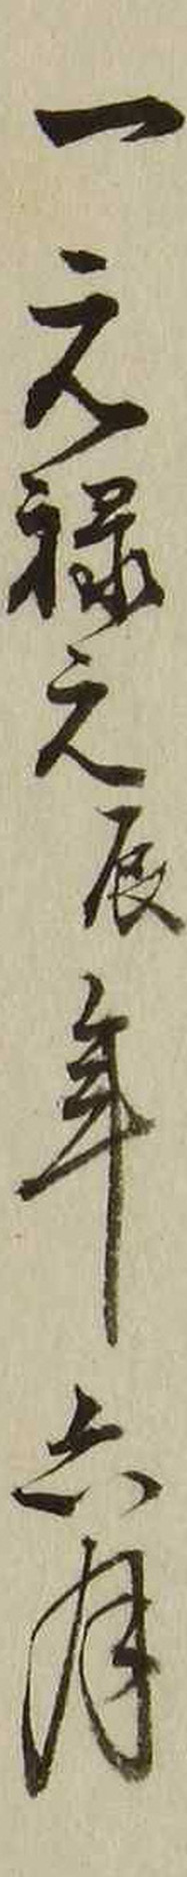一元禄元辰年六月
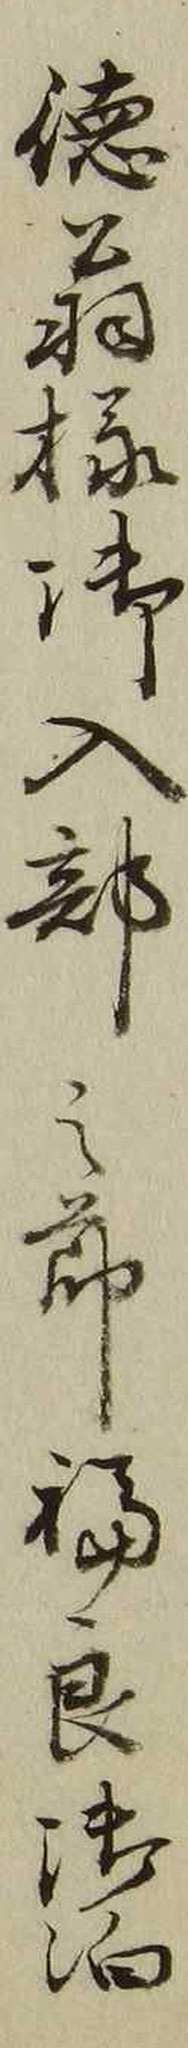徳翁様御入部之節福良御泊
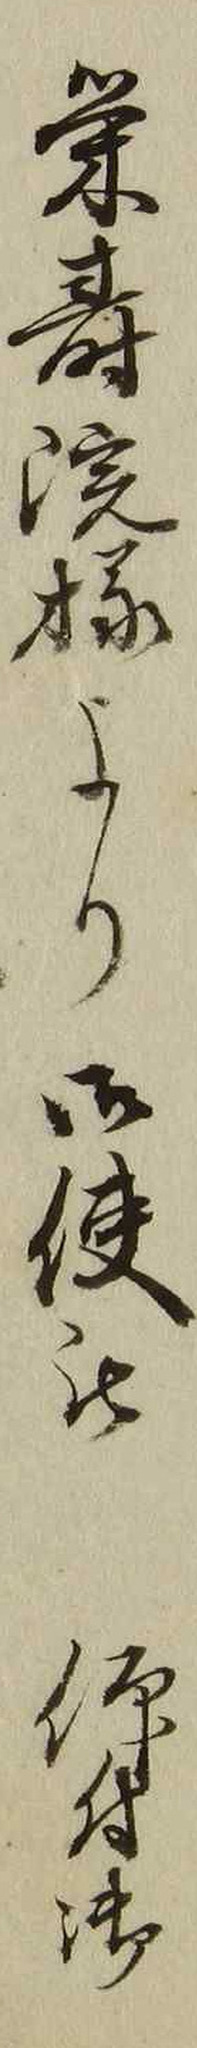栄寿院様より御使被仰付御
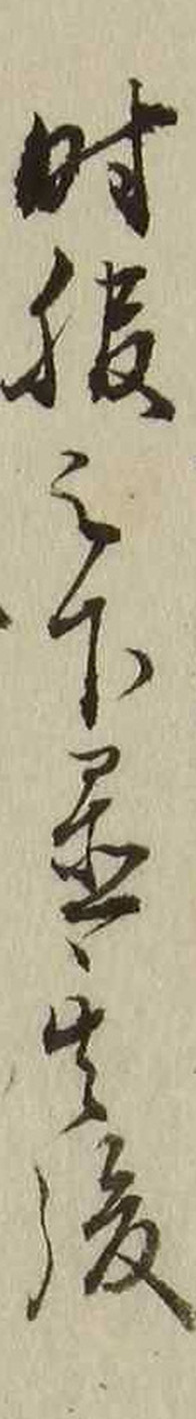時服被下置其後
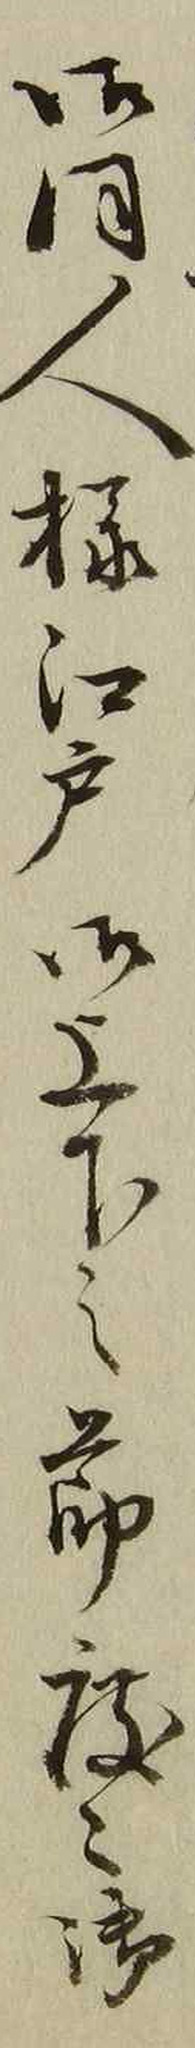御同人様江戸御上下之節度々御
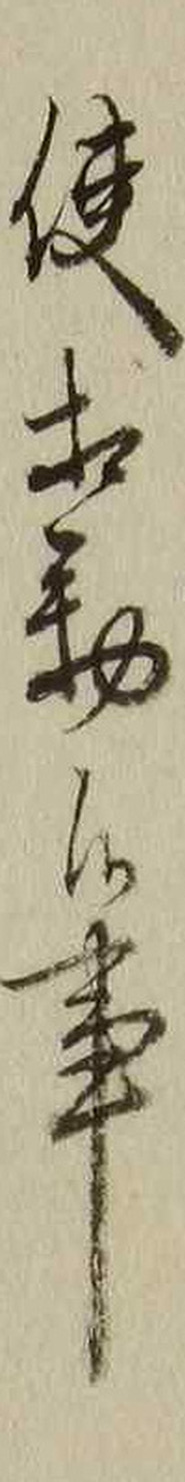使相勤候事
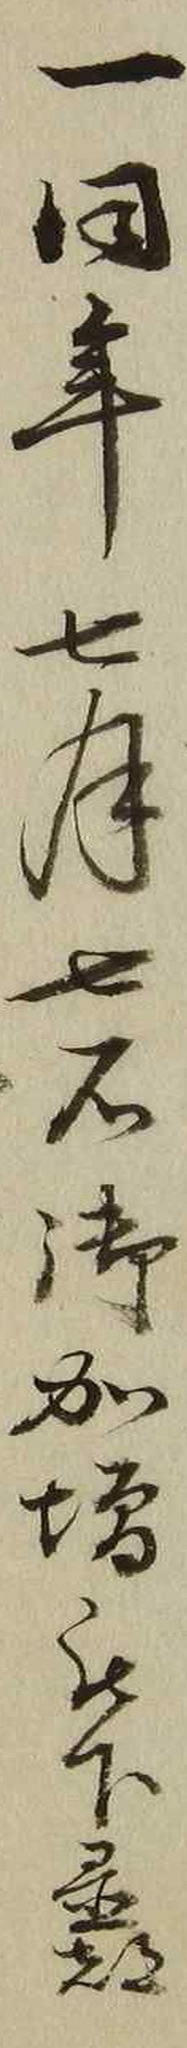一同年七月七石御加増被下置都
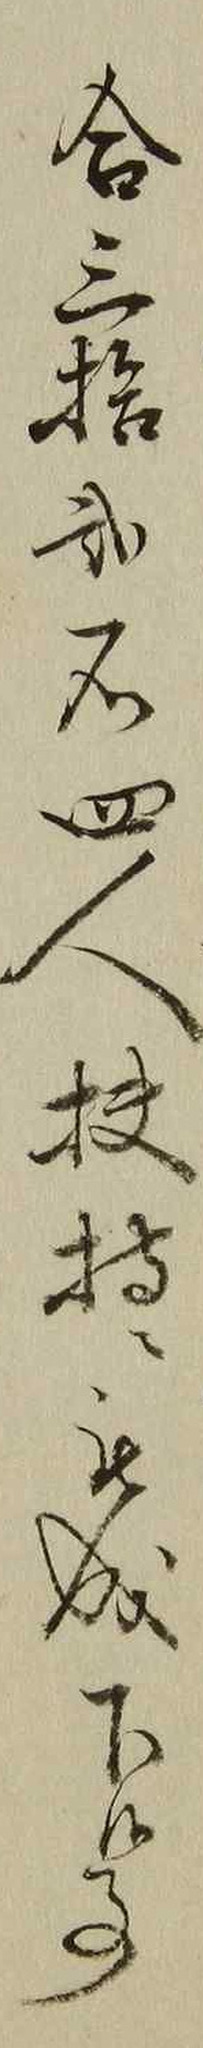合三拾弐石四人扶持ニ被成下候事
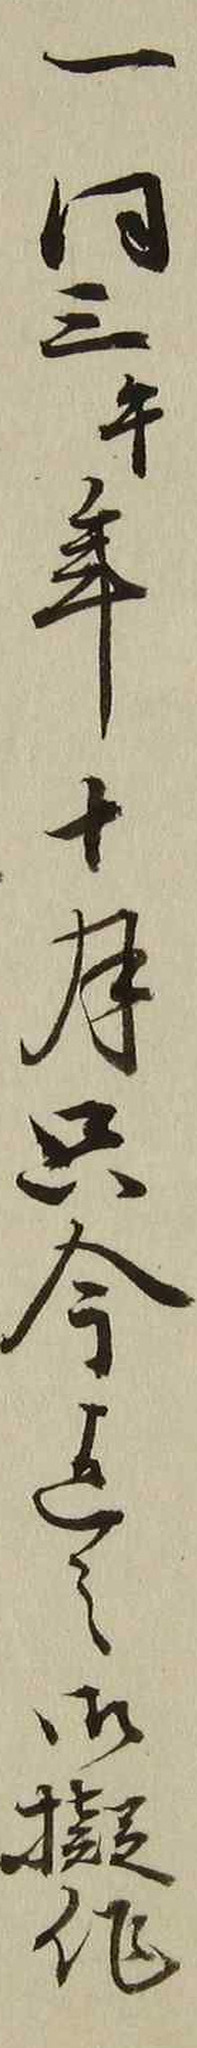一同三午年十月只今迄之御擬作
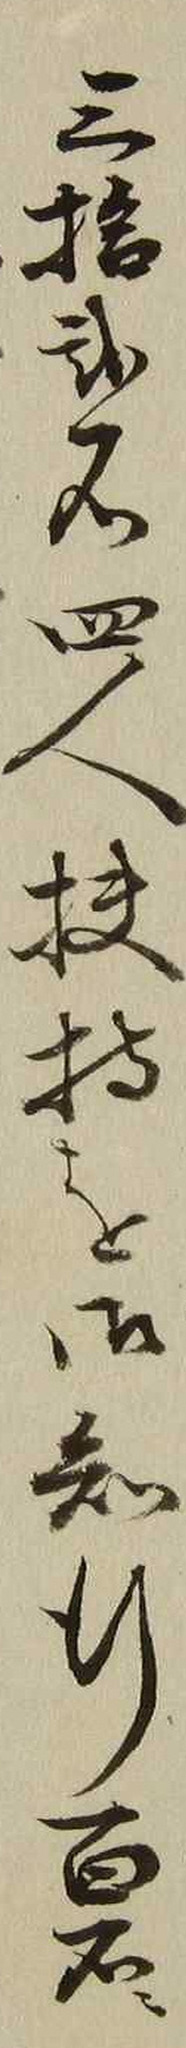三拾弐石人四扶持を御知行百石ニ
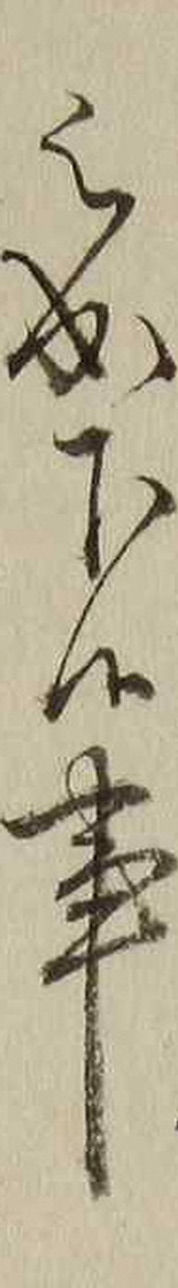被成下候事
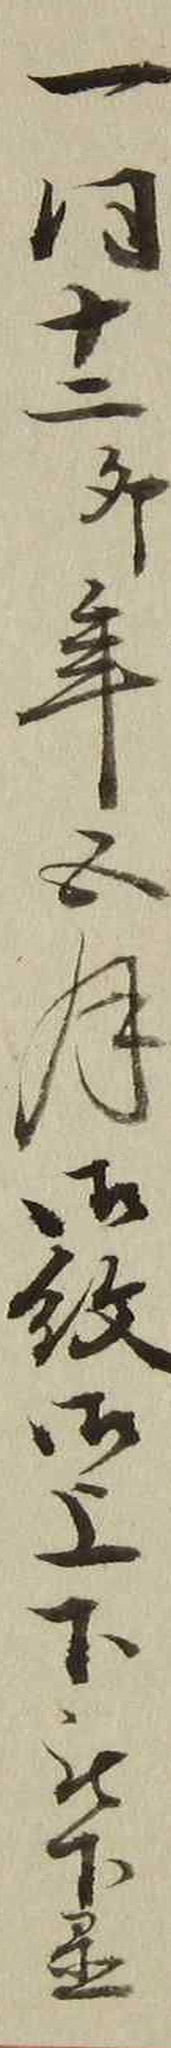一同十二卯年五月御紋御上下被下置
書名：諸士系譜　巻之36　は之部4
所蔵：会津若松市立会津図書館
